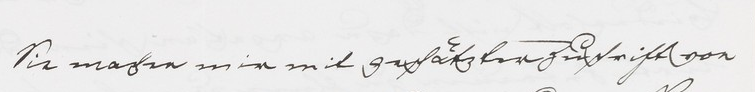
Sie machen mir mit geschätzter Zuschrift von
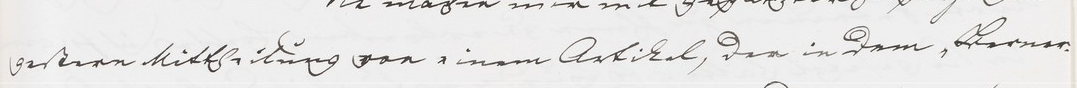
gestern Mittheilung von einem Artikel, der in dem «Berner -
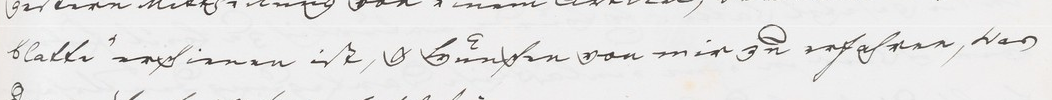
blatte» erschienen ist, & wünschen von mir zu erfahren, was
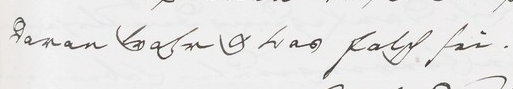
daran wahr & was falsch sei.
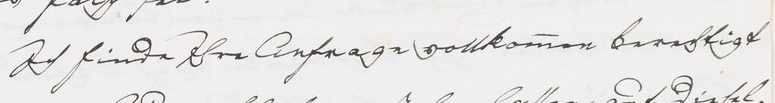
Ich finde Ihre Anfrage vollkommen berechtigt
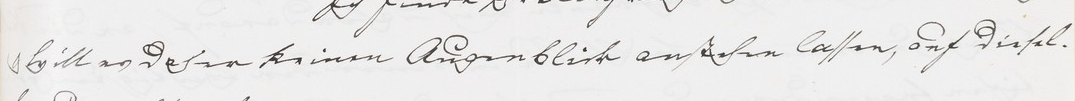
& will es daher keinen Augenblick anstehen lassen, auf diesel-
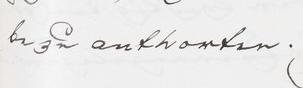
be zu antworten.
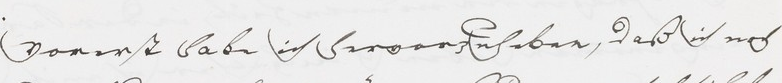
Vorerst habe ich hervorzuheben, daß ich noch
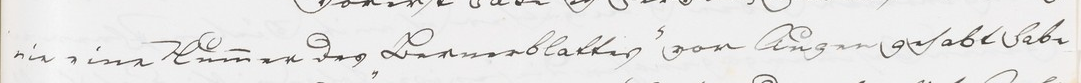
nie eine Nummer des «Bernerblattes» vor Augen gehabt habe
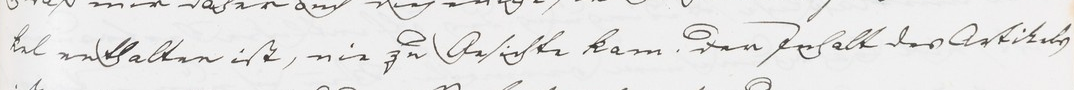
kel enthalten ist, nie zu Gesichte kam. Der Inhalt des Artikels
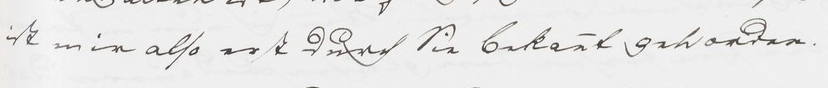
ist mir also erst durch Sie bekannt geworden.
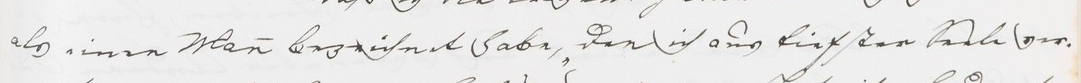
als einen Mann bezeichnet habe, «den ich aus tiefster Seele ver-
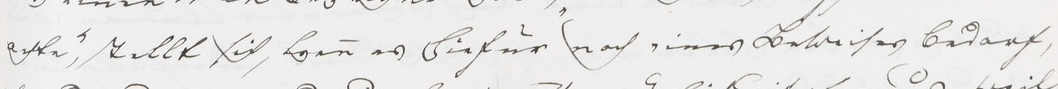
achte», stellt sich, wenn es hiefür noch eines Beweises bedarf,
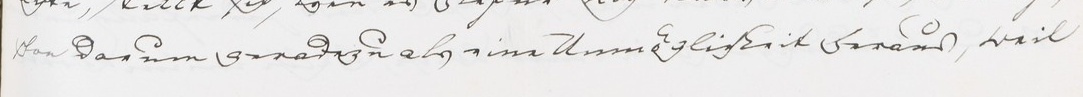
schon darum geradezu als eine Unmöglichkeit heraus, weil
